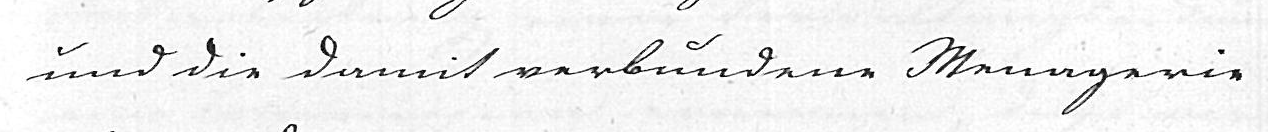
und die damit verbundene Menagerie
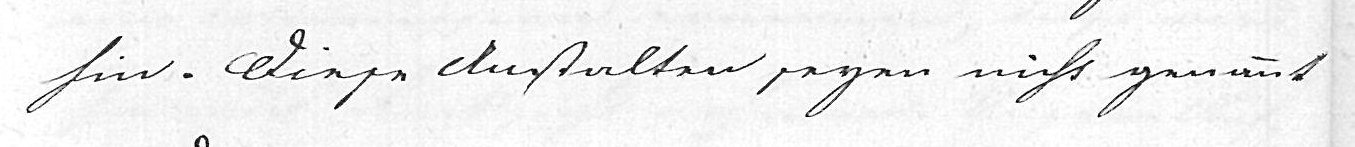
hin. Diese Anstalten seyen nicht genannt
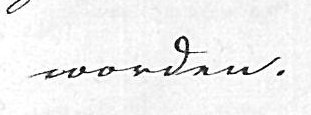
worden.
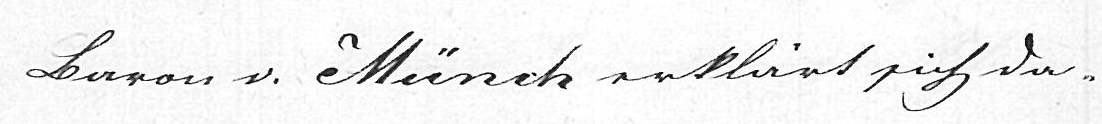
Baron v. Münch erklärt sich da-
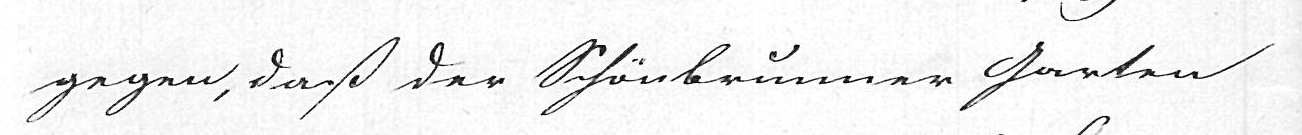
gegen, daß der Schönbrunner Garten
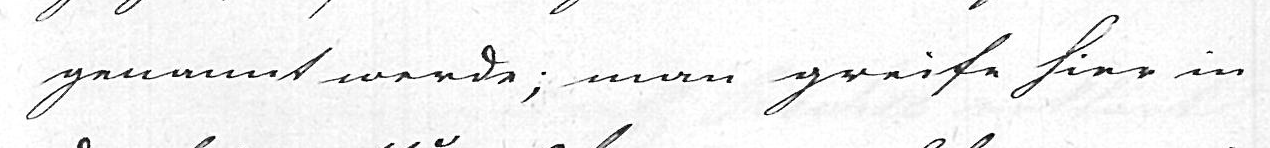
genannt werde, man greife hier in
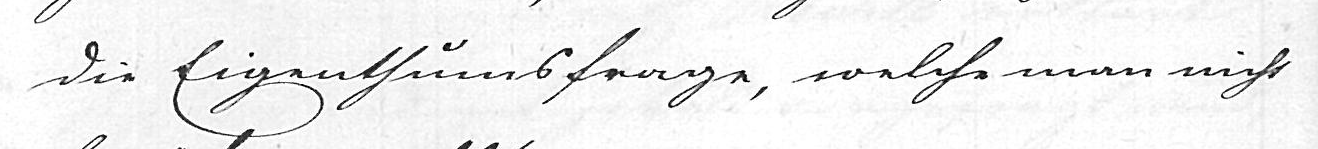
die Eigenthunsfrage, welche man nicht
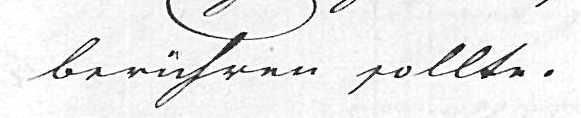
berühren sollte.
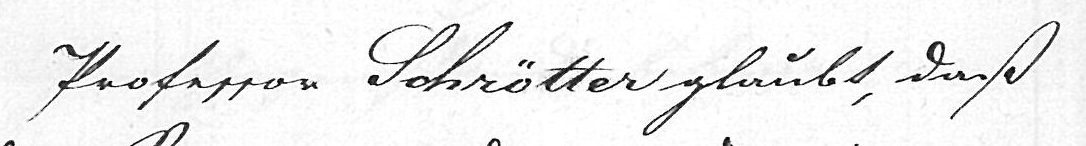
Professor Schrötter glaubt, daß
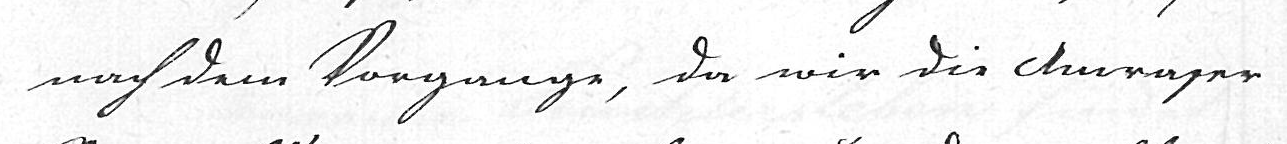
nach den Vorgange, da wir die Amraser
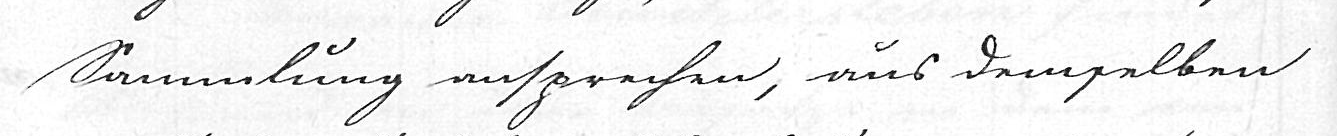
Sammlung ansprechen, aus demselben
